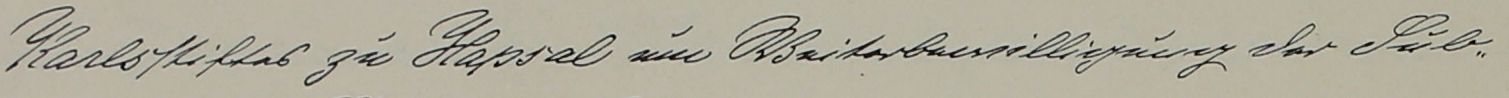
Karlsstiftes zu Hapsal um Weiterbewilligung der Sub-
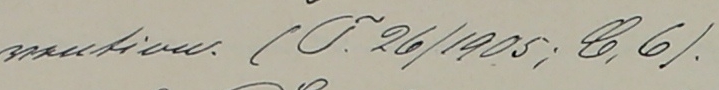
vention (T.26/1905; C.6).
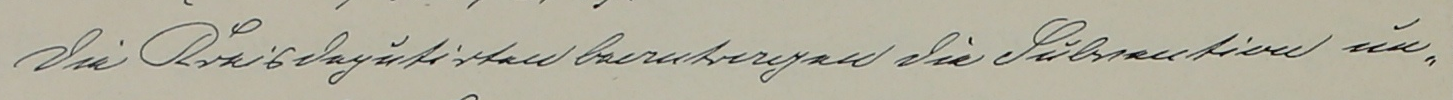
Die Kreisdeputirten beantragen die Subvention un-
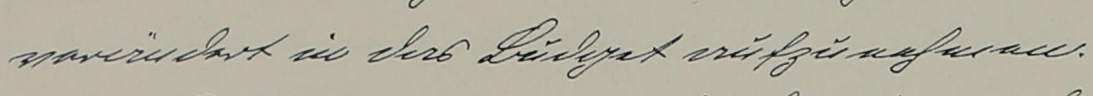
verändert in das Budget aufzunehmen.
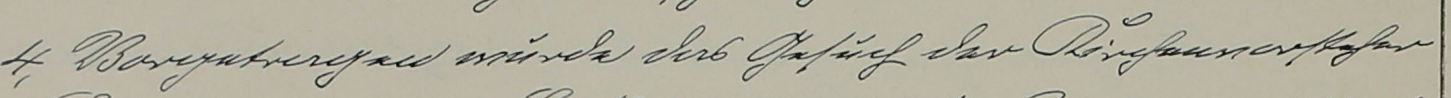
4. Vorgetragen wurde das Gesuch der Kirchenvorsteher
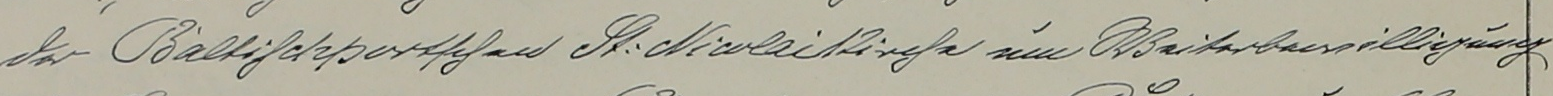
der Baltischportschen St. Nicolaikirche um Weiterbewilligung
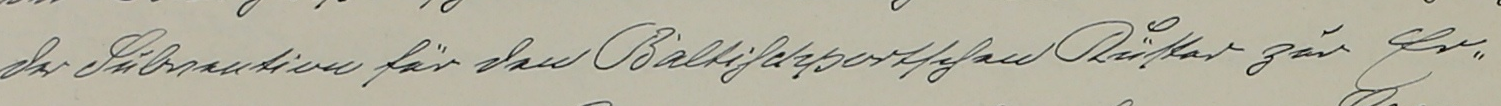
der Subvention für den Baltischportschen Küster zur Er-
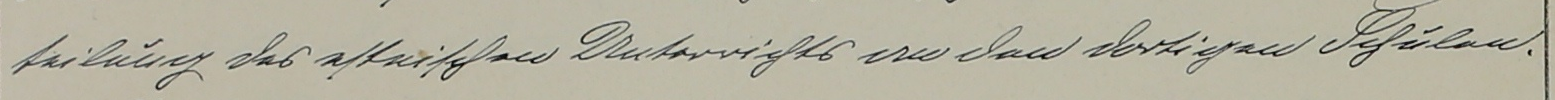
teilung des estnischen Unterrichts an den dortigen Schulen.
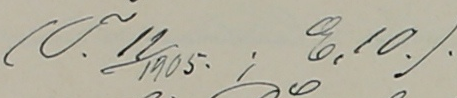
(T.11/1905; E.10).
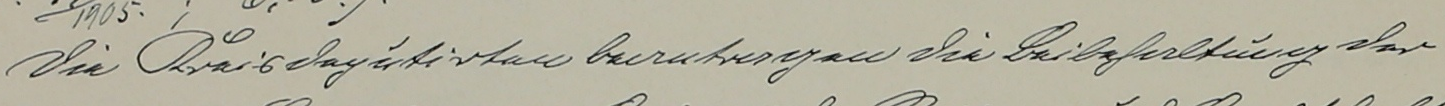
Die Kreisdeputirten beantragen die Beibehaltung der
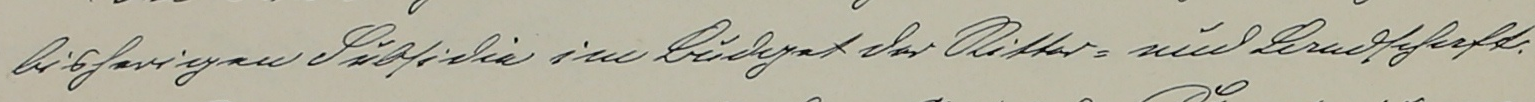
bisherigen Subsidie im Budget der Ritter- und Landschaft.
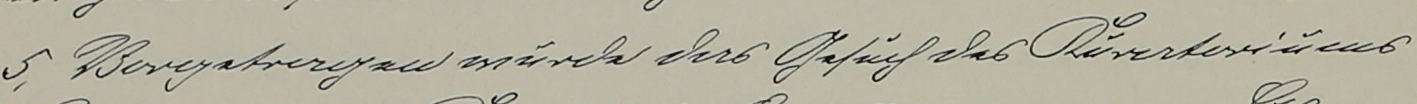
5. Vorgetragen wurde das Gesuch des Kuratoriums
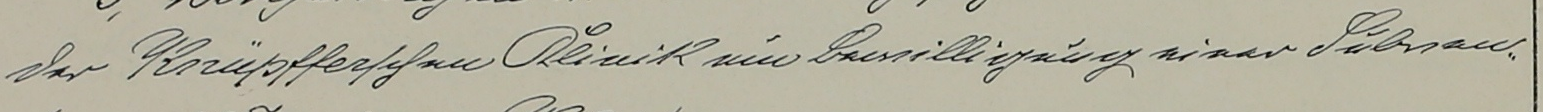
der Knüpfferschen Klinik um Bewilligung einer Subven-
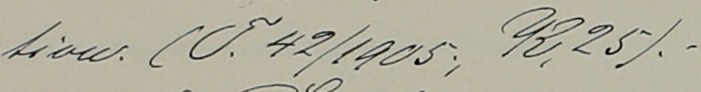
tion. (T.42/1905; K.25).
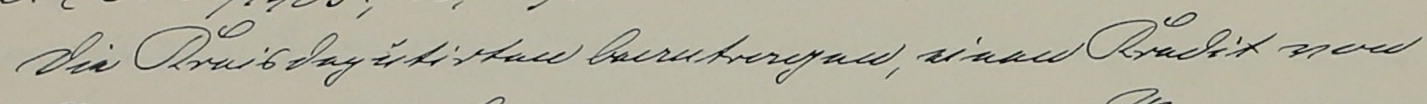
Die Kreisdeputirten beantragen, einen Kredit von
